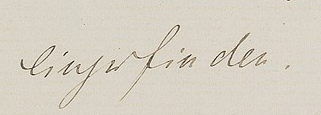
einzufinden.
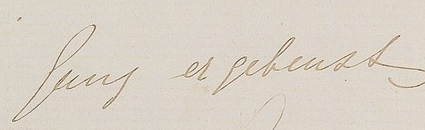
Ganz ergebenst
